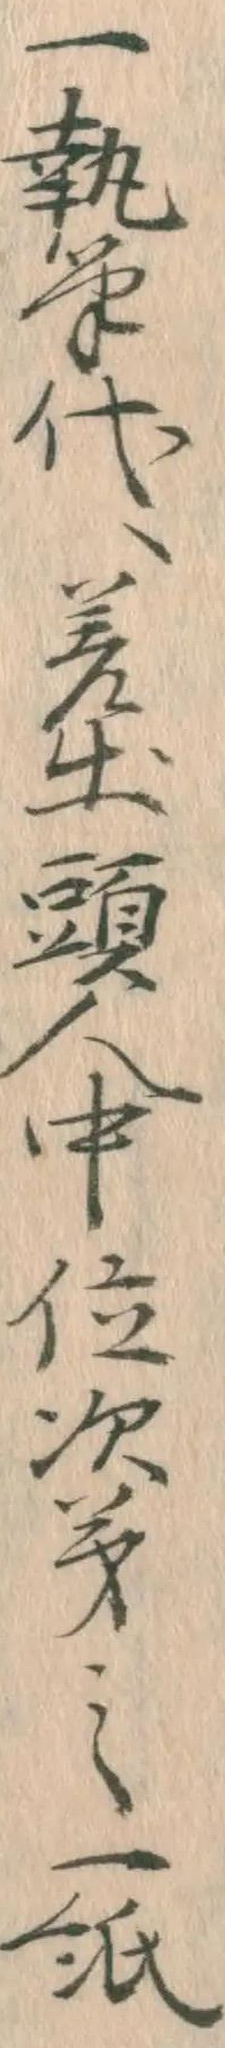一執筆代へ差出頭人中位次第之一紙
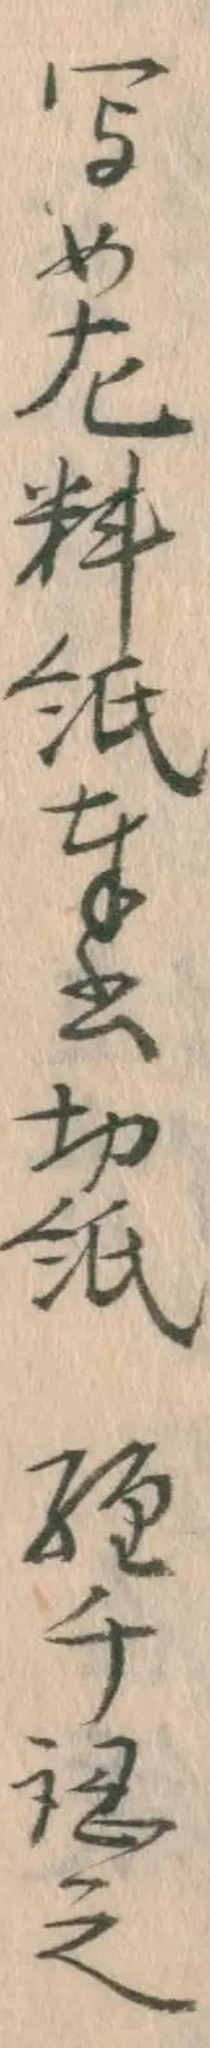写如左料紙奉書切紙経千認之
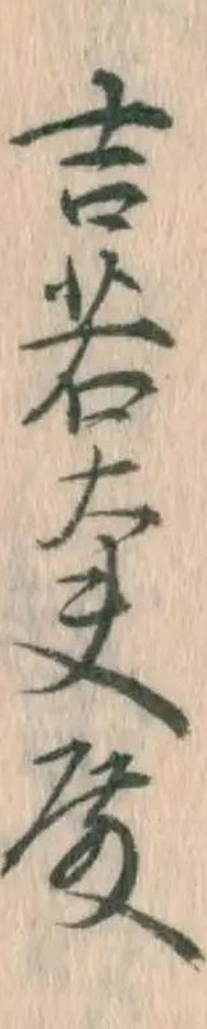吉若大夫殿
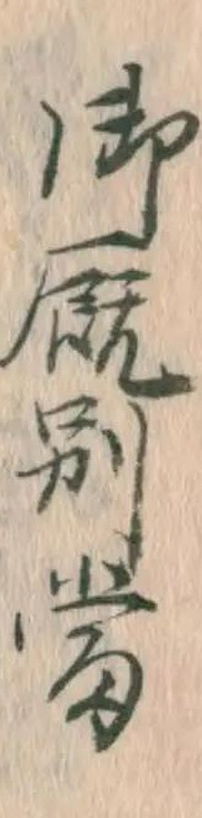御厩別當
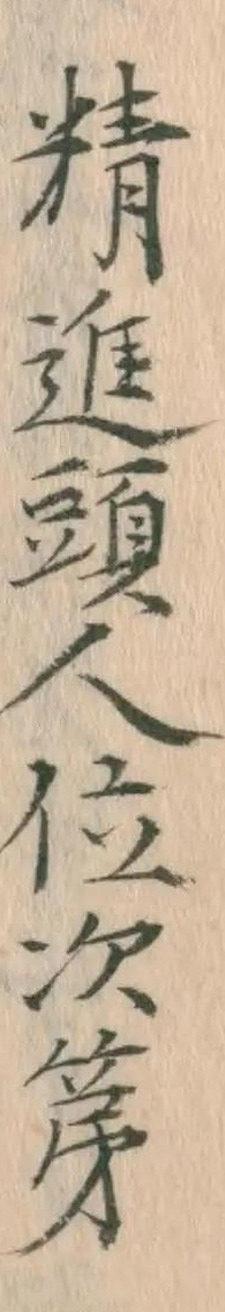精進頭人位次第
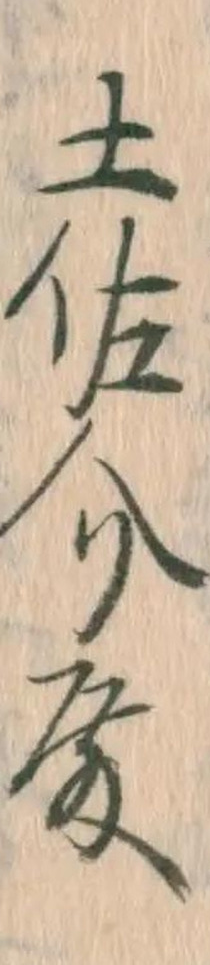土佐介殿
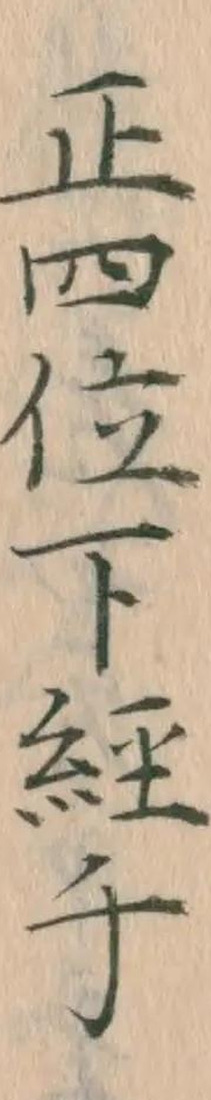正四位下経千
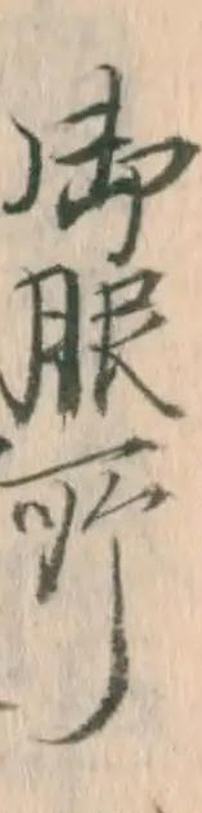御服所
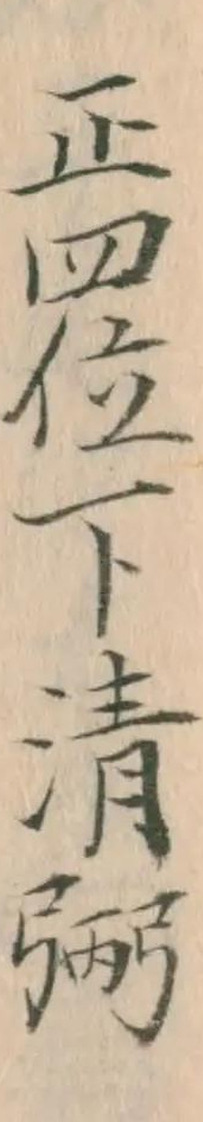正四位下清弼
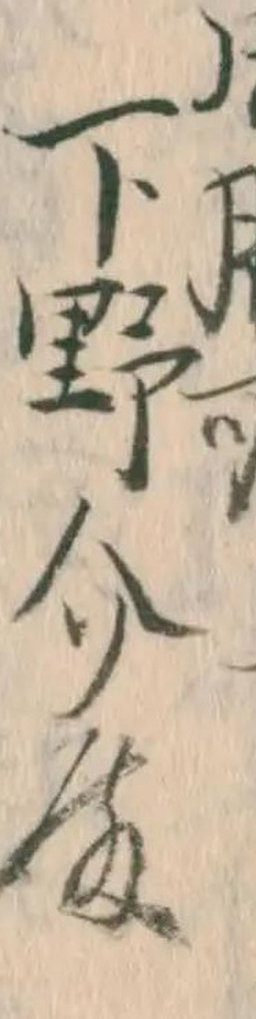下野介殿
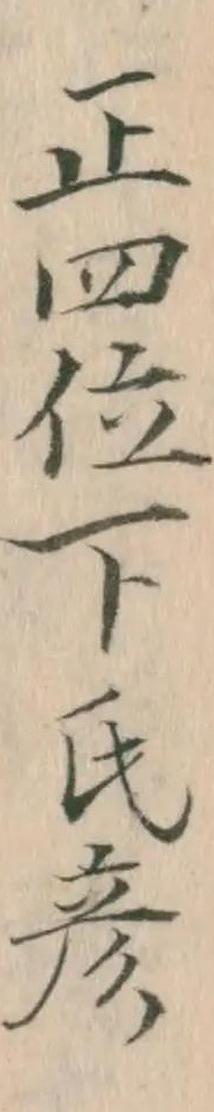正四位下氏彦
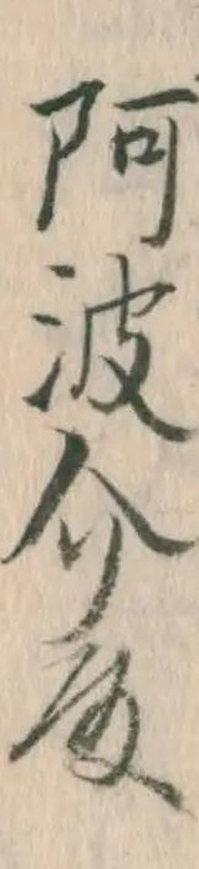阿波介殿
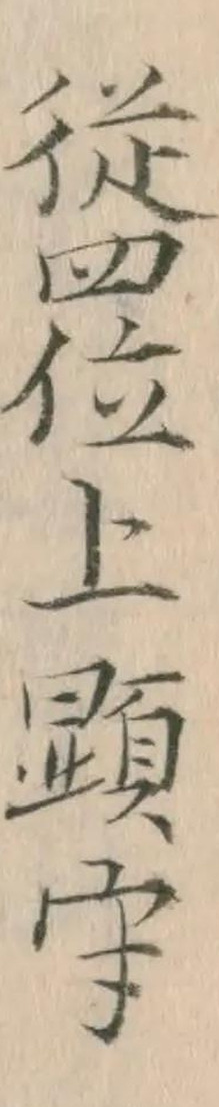従四位上顕守
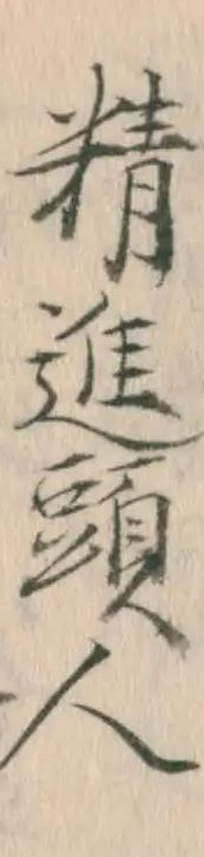精進頭人
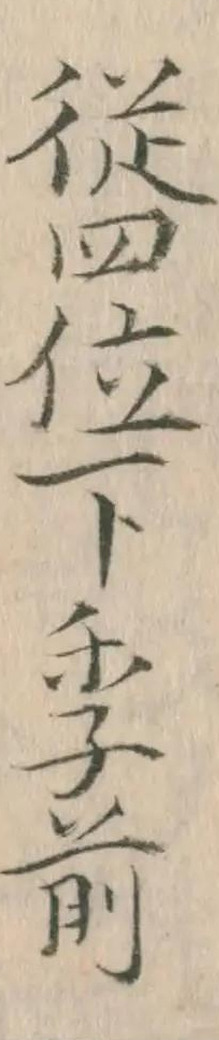従四位下季前
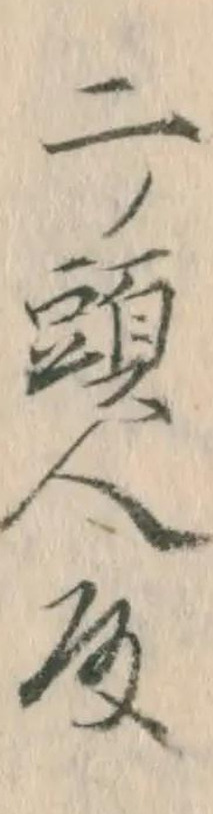二ノ頭人殿
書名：賀茂社記録. 第73冊
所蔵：国立国会図書館 National Diet Library, JAPAN
